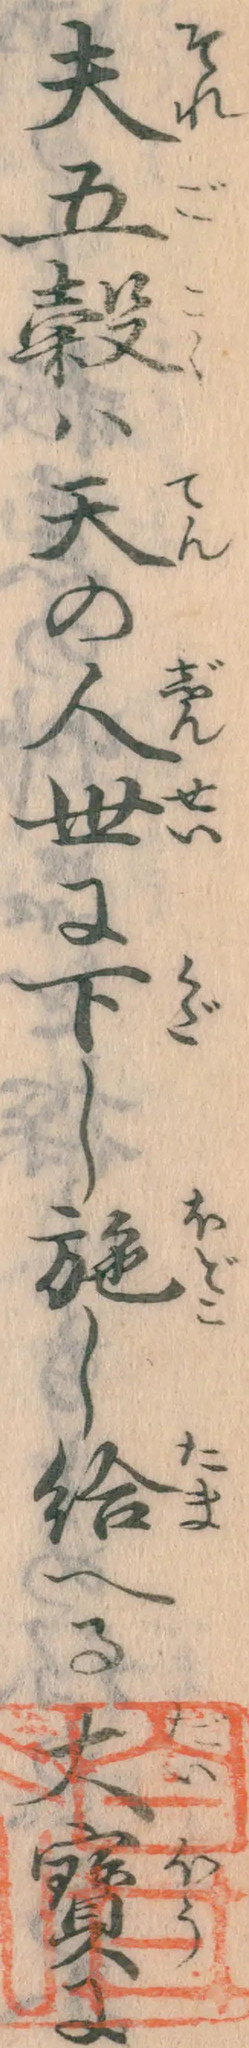夫五穀は天の人世に下し施し給へる大寶に
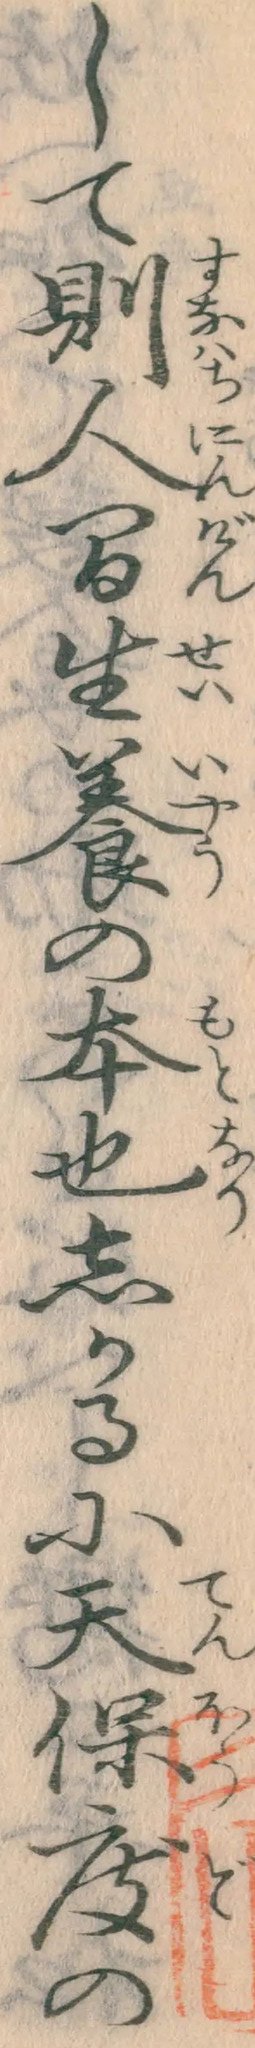して則人間生養の本也しかるに天保度の
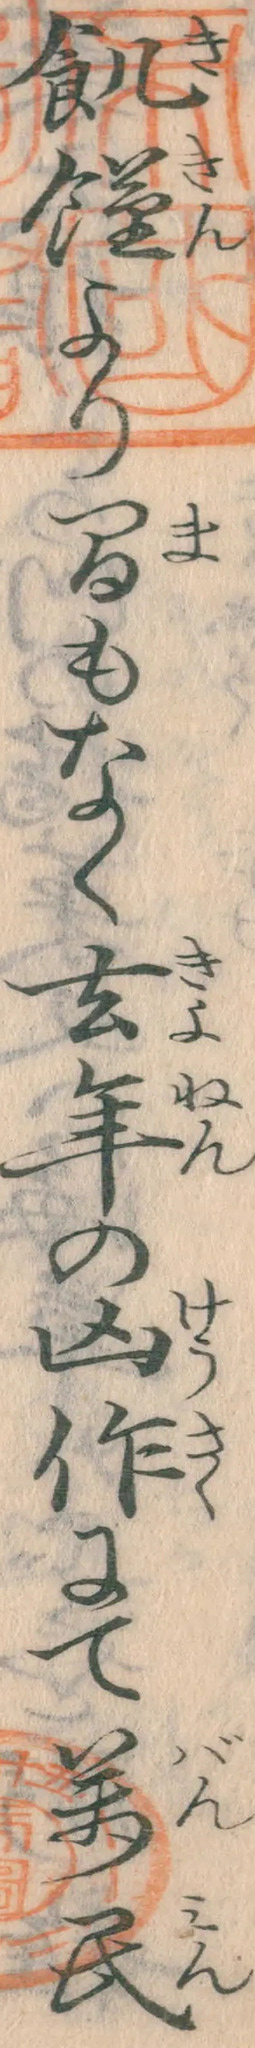飢饉より間もなく去年の凶作にて万民
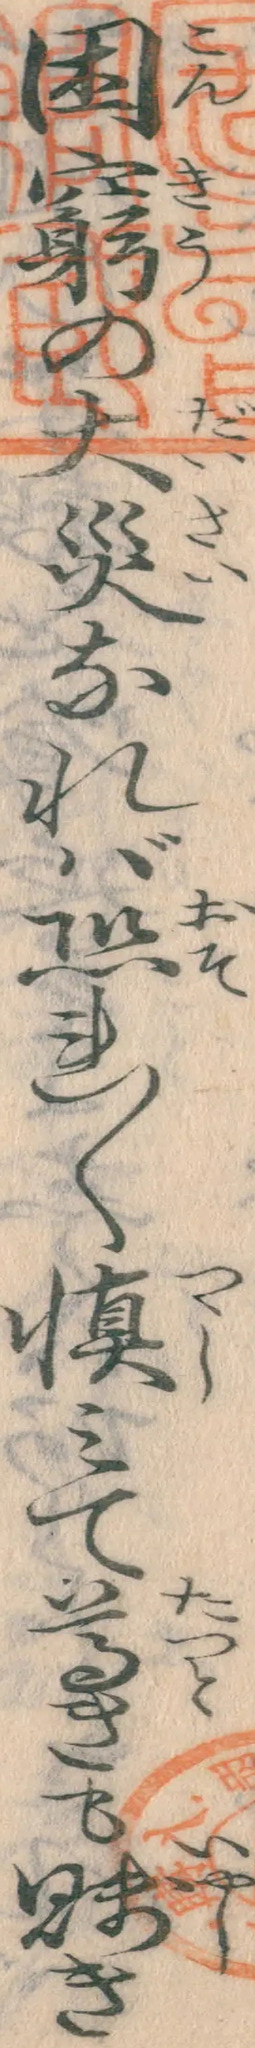困窮の大災なれば恐れ〳〵慎みて尊きも賤き
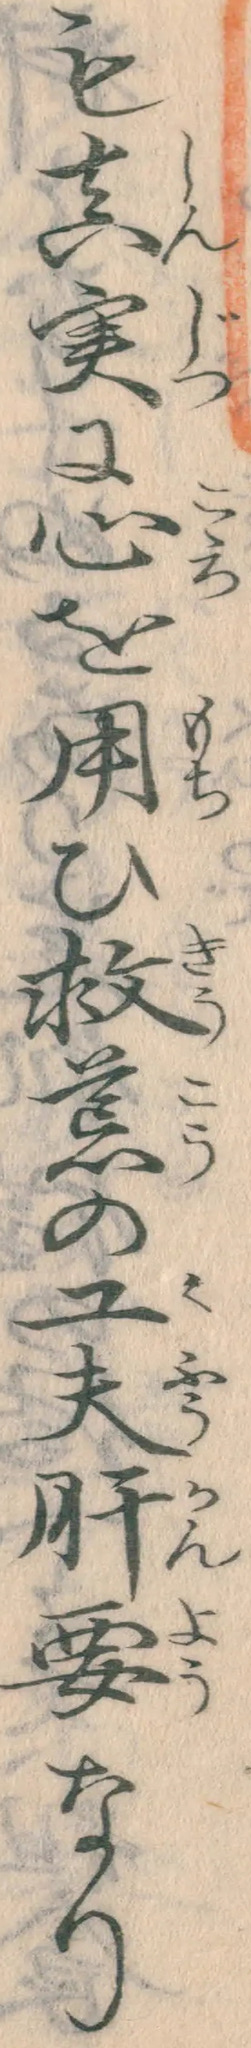も真実に心を用ひ救荒の工夫肝要なり
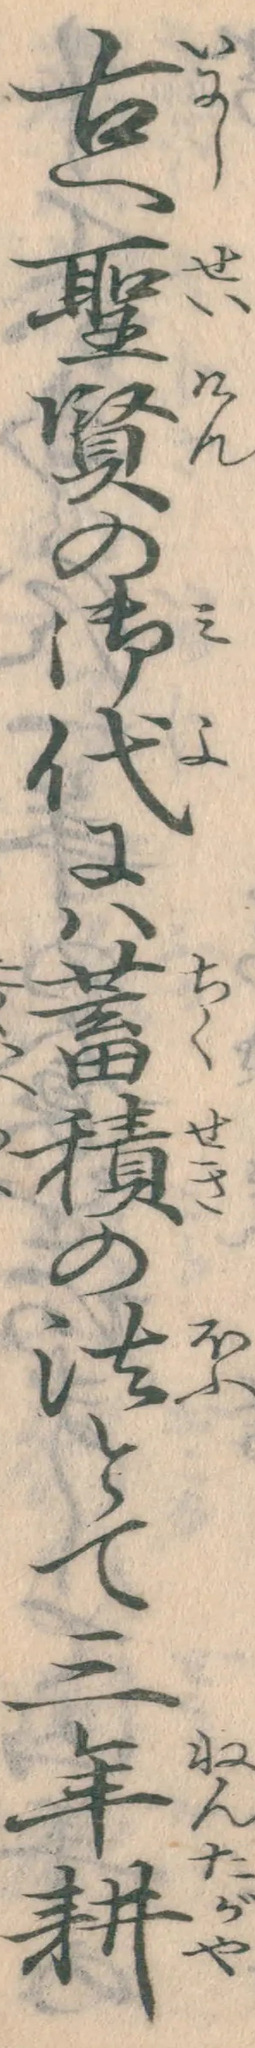古へ聖賢の御代には蓄積の法とて三年耕

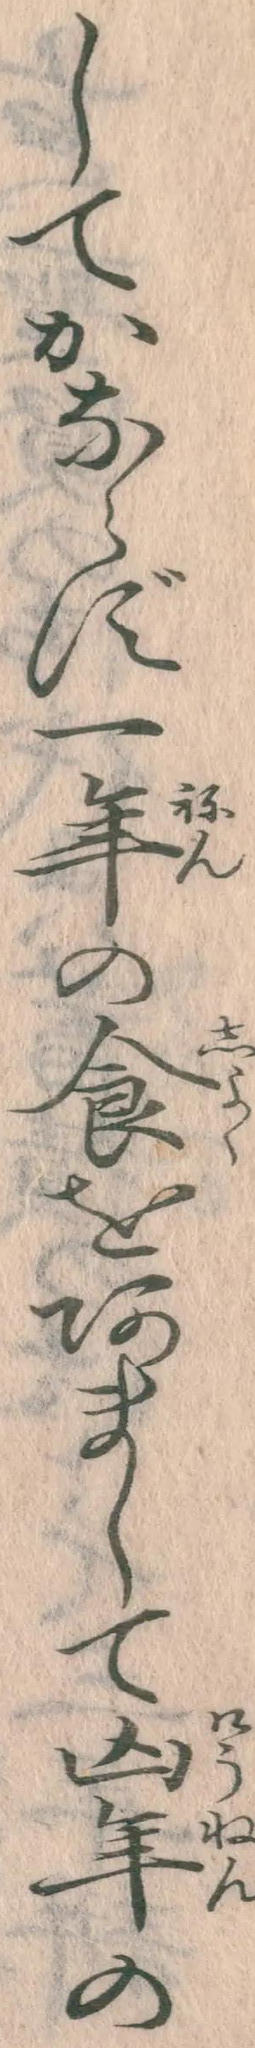してかならず一年の食をあまして凶年の
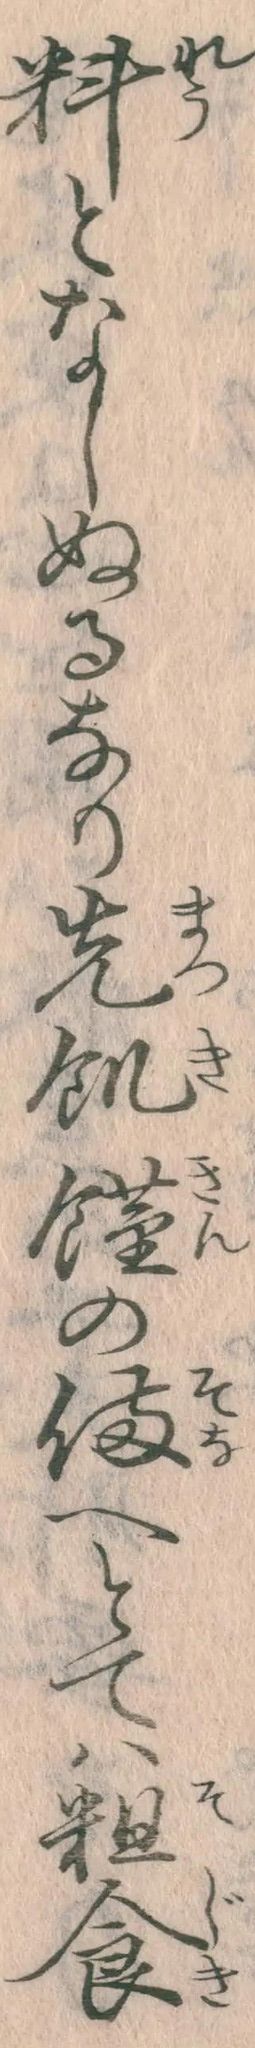料となしぬるなり先飢饉の備へとては粗食
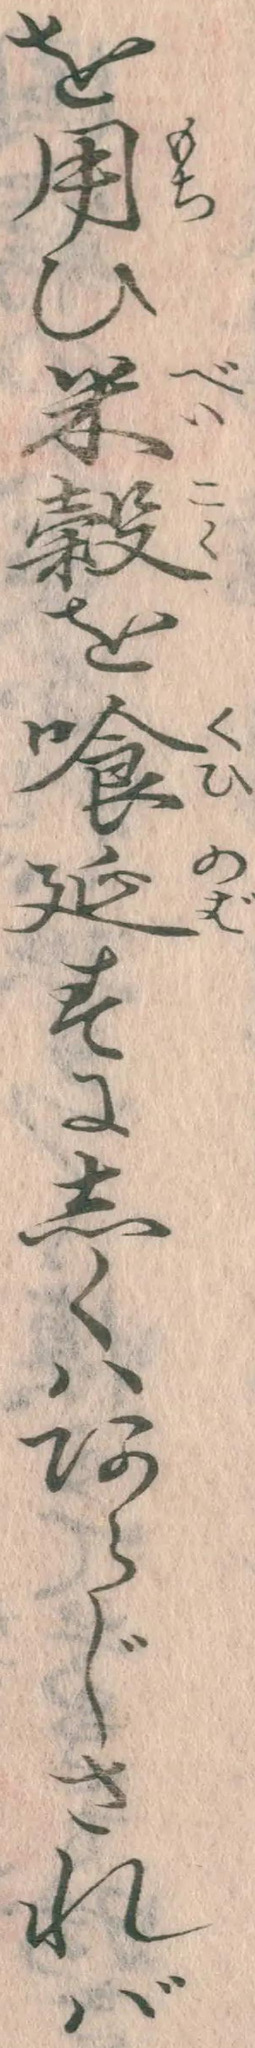を用ひ米穀を喰延すにしくはあらじされば
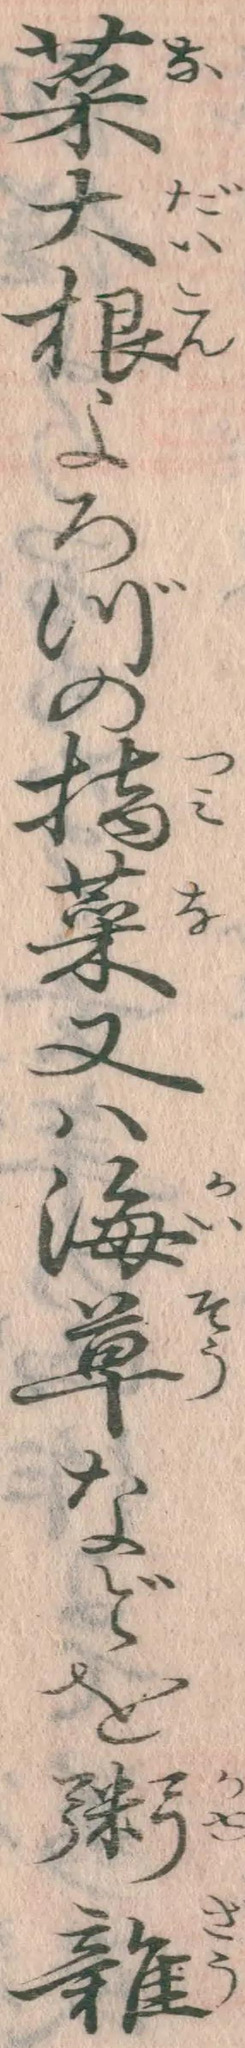菜大根よろづの摘菜又は海草などを粥雑
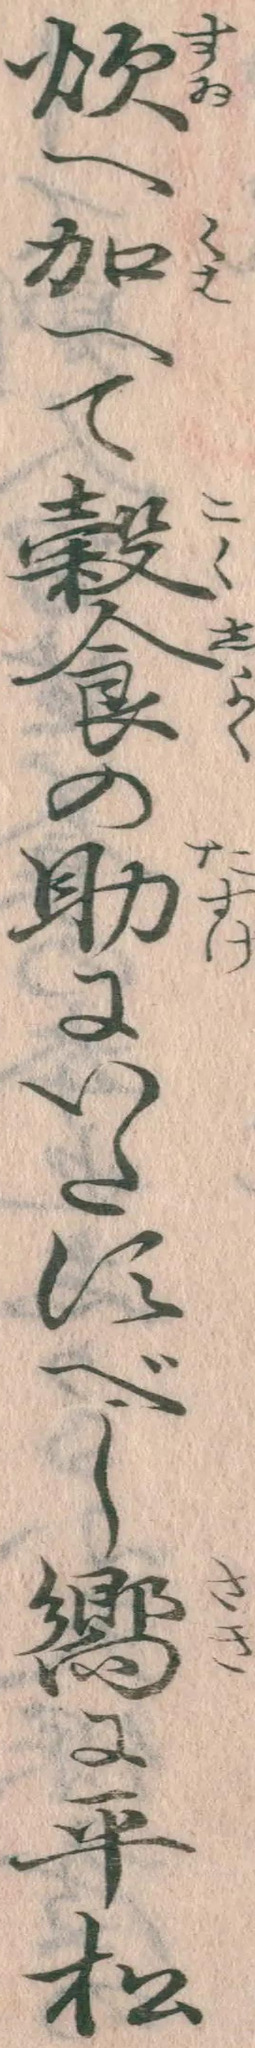炊へ加へて穀食の助にいたすべし嚮に平松
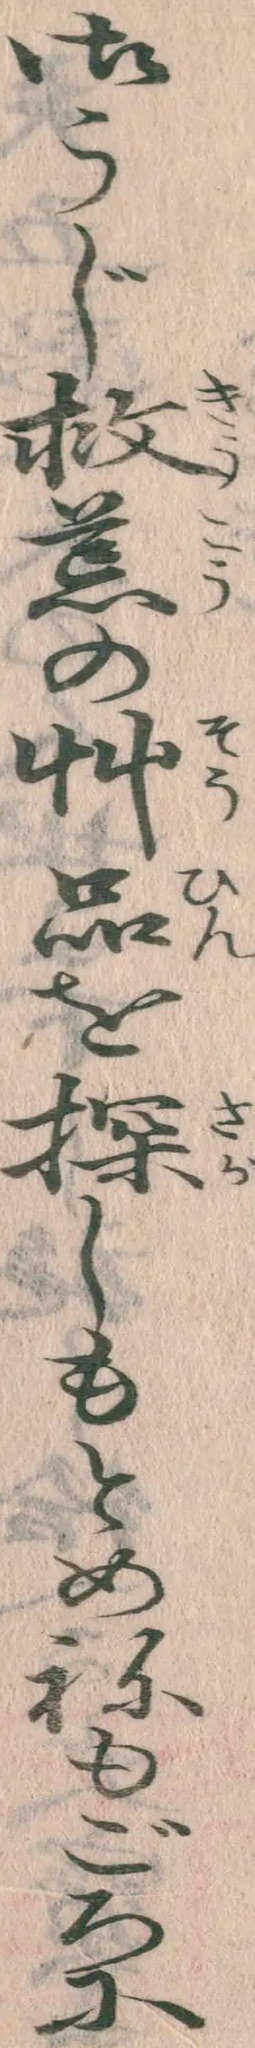御うじ救荒の艸品を探しもとめねもごろに
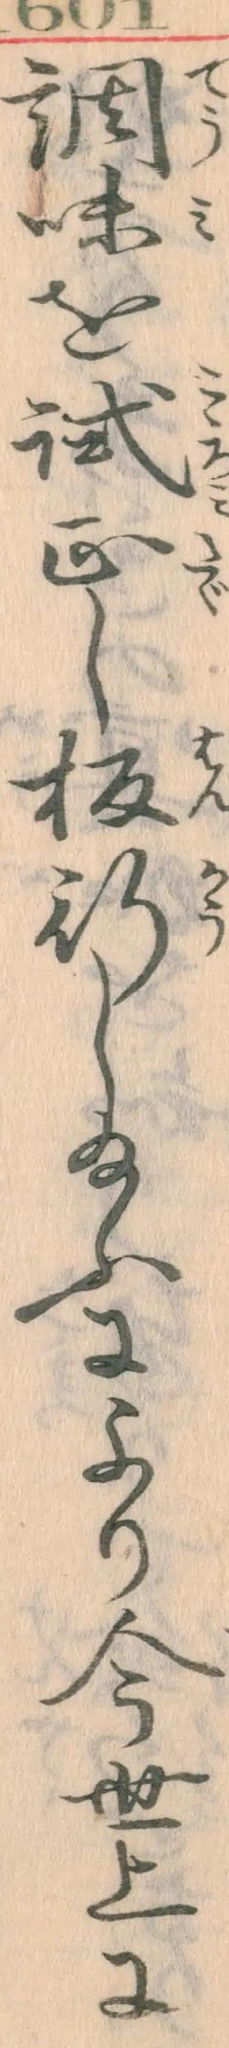調味を試正し板行し給ふにより今世上に
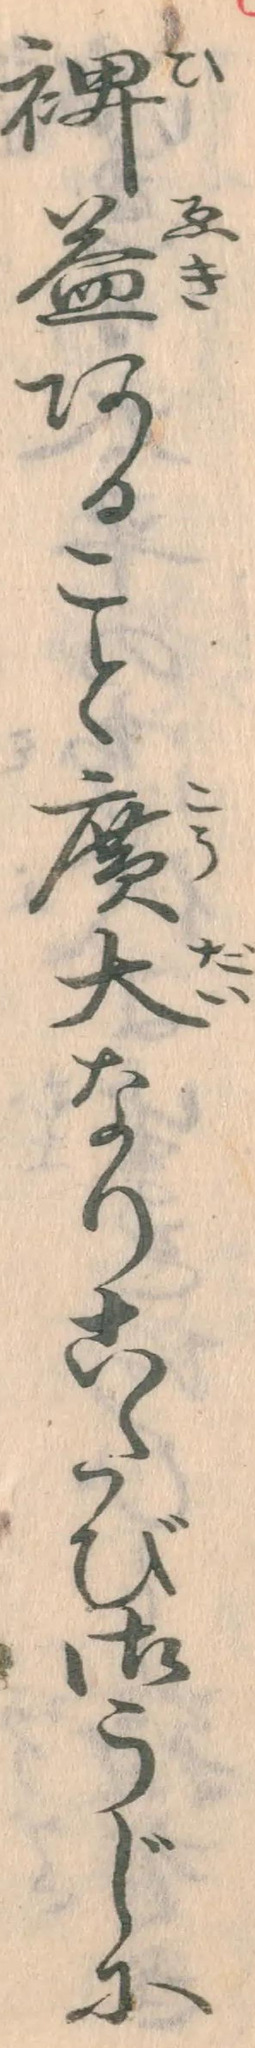裨益あること広大なりこたび御うじに
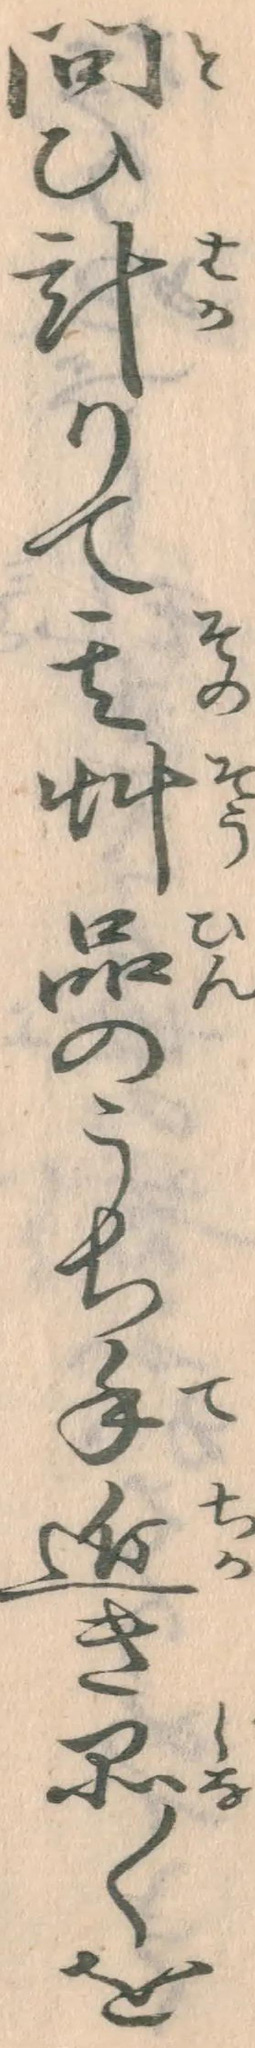問ひ計りて其艸品のうち手近き品〳〵を
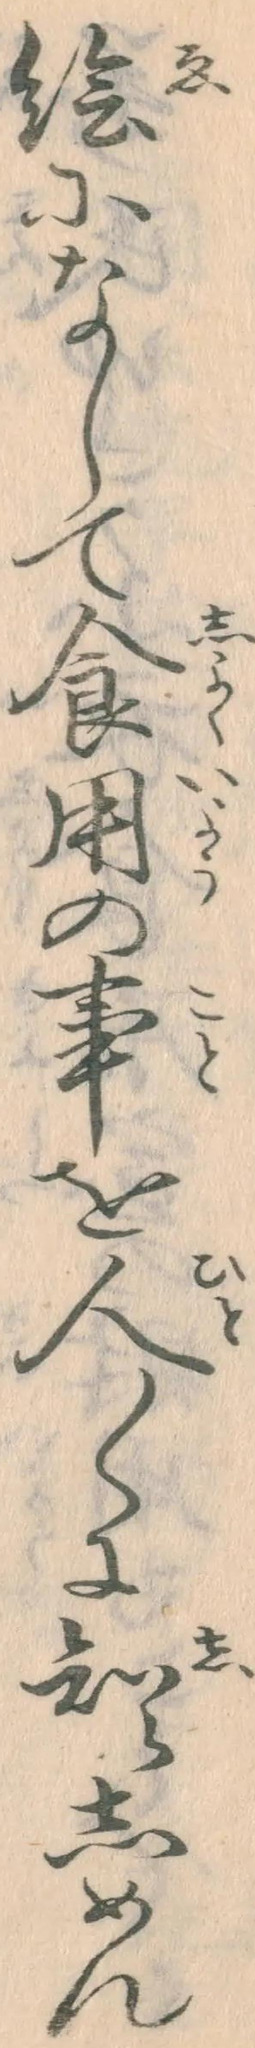絵になして食用の事を人〳〵に知らしめん
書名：救荒野菜圖説
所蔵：国立国会図書館 National Diet Library, JAPAN
